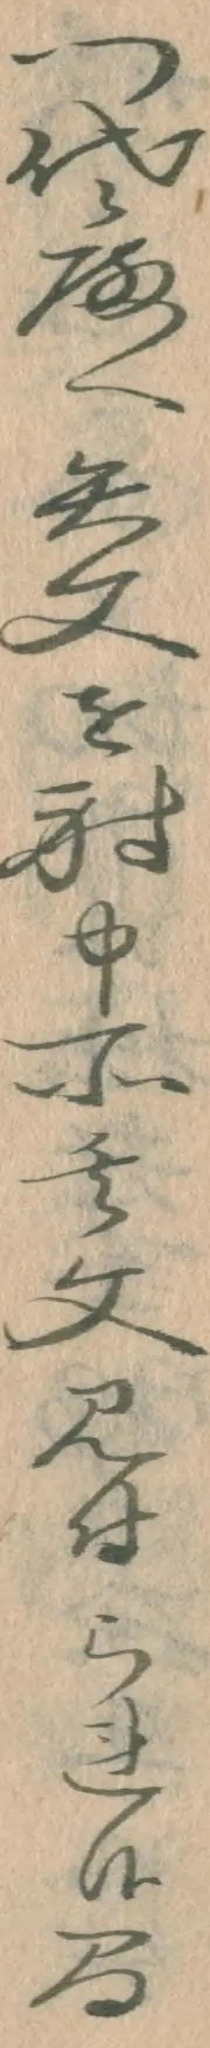門佐殿へ矢文を射申所其父見付ら連候間
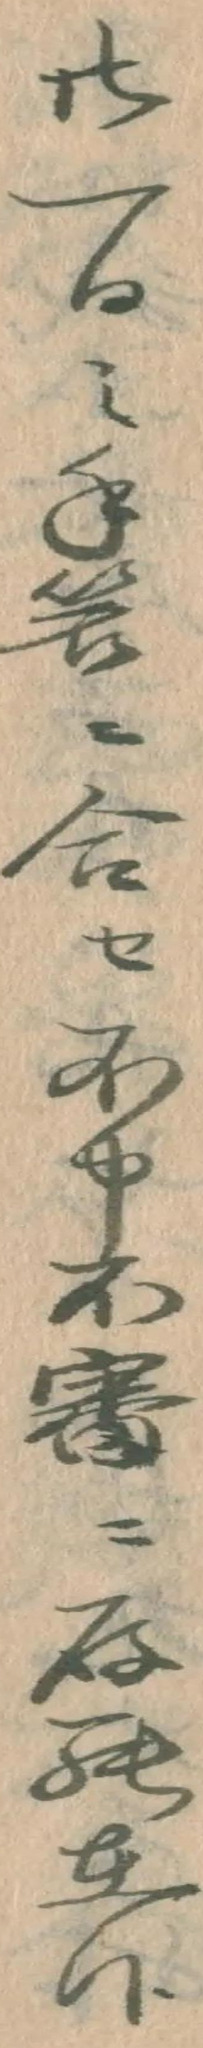廿一日之手筈に合せ不申不審に存罷在候
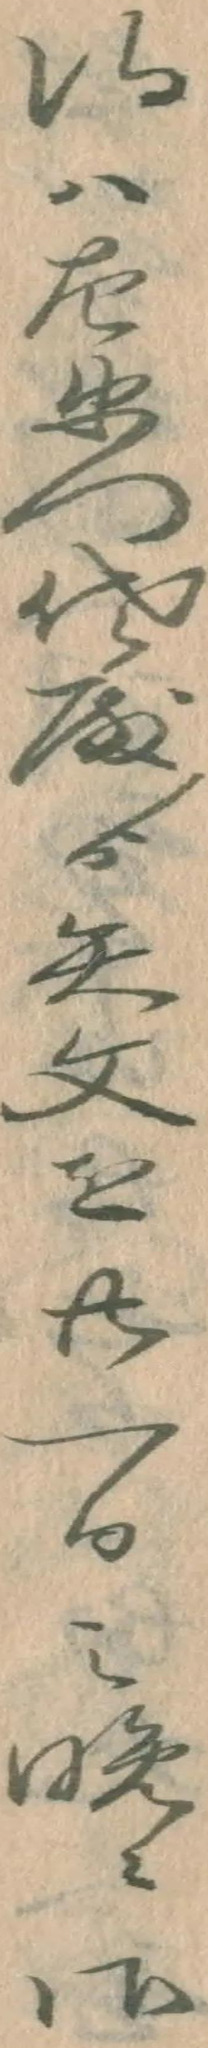得は左衛門佐殿ゟ矢文を廿一日之晩に御
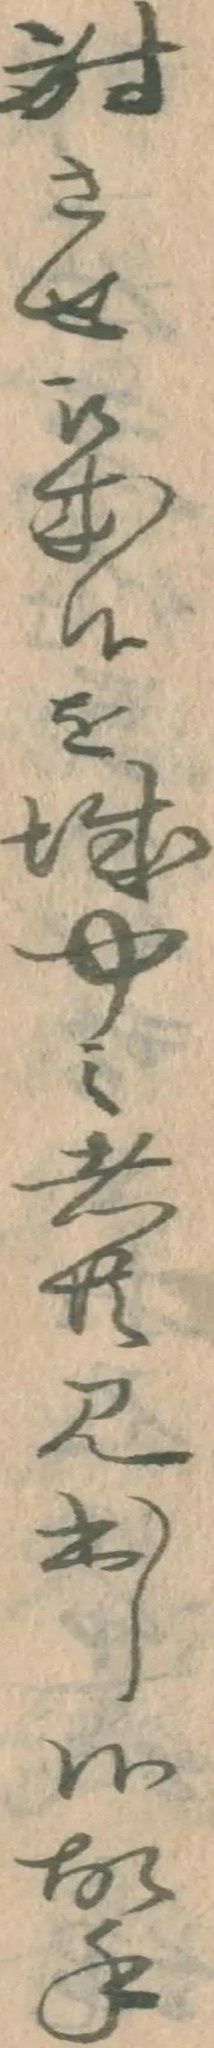射させ被成候を城中之者共見出し候故手
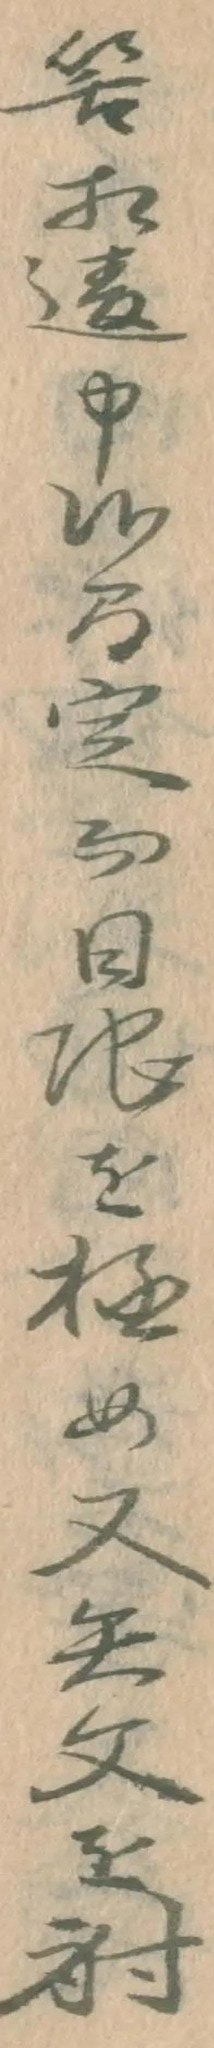筈相違申候間定而日限を極め又矢文を射

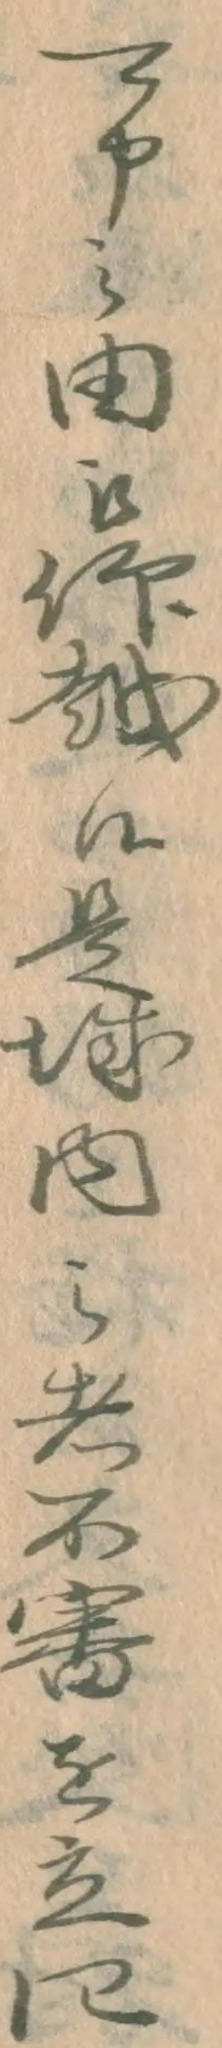可申之由被仰越候是城内之者不審を立四
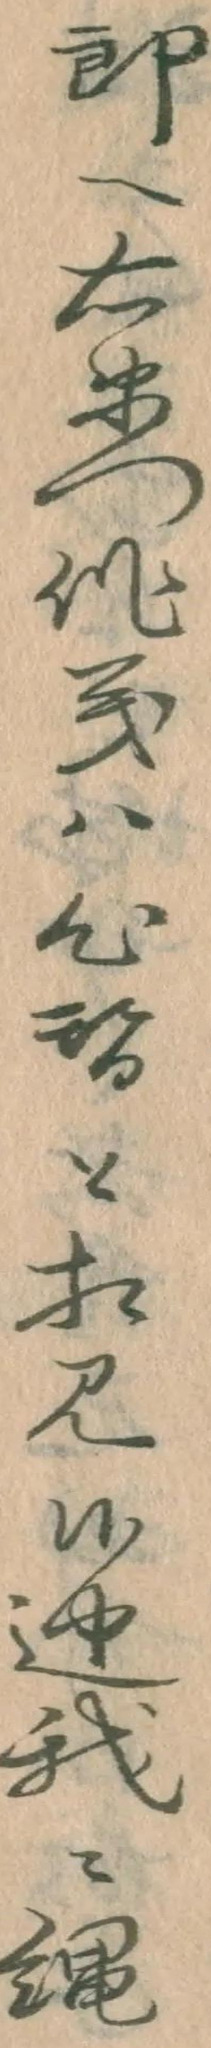郎へ右衛門作義は心替と相見候迚我に縄
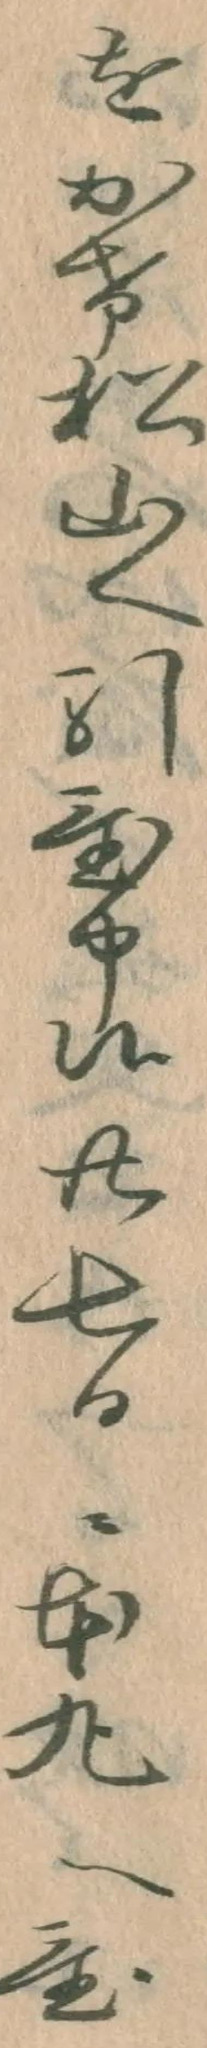をか希松山へ引置申候廿七日に本丸へ置
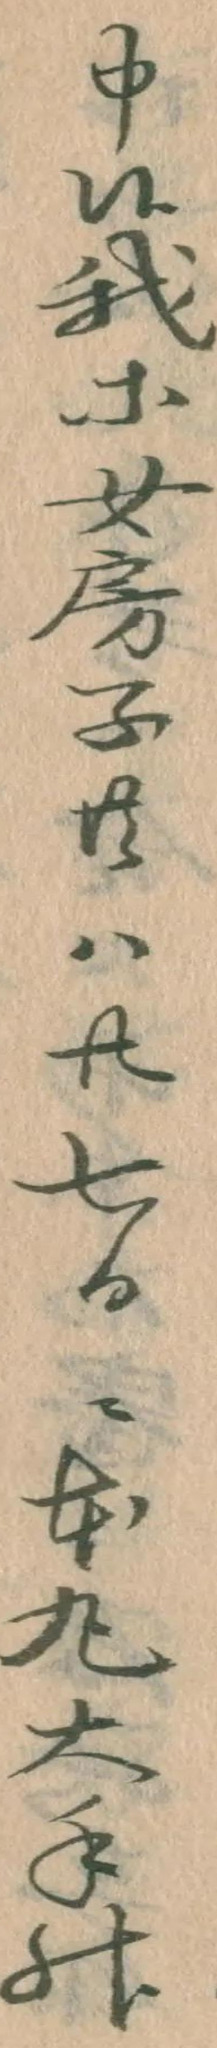申候我等女房子共は廿七日に本丸大手升
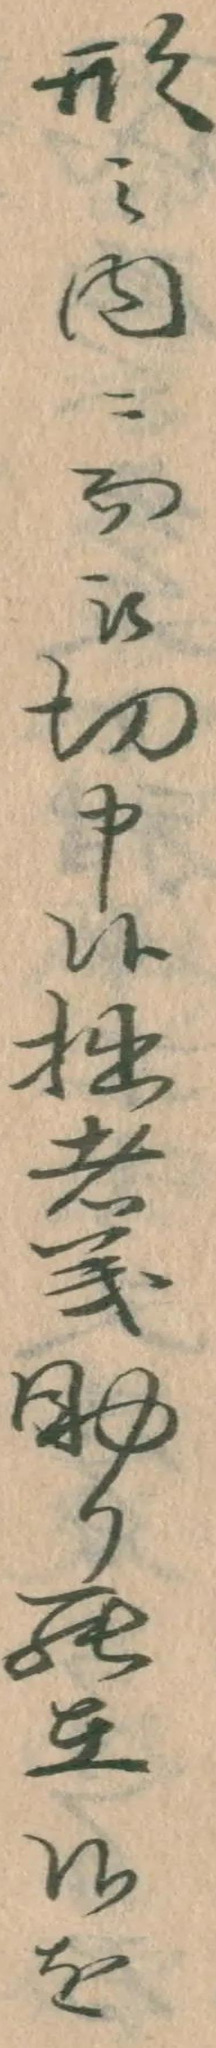形之内に而被切申候拙者義助り罷在候を
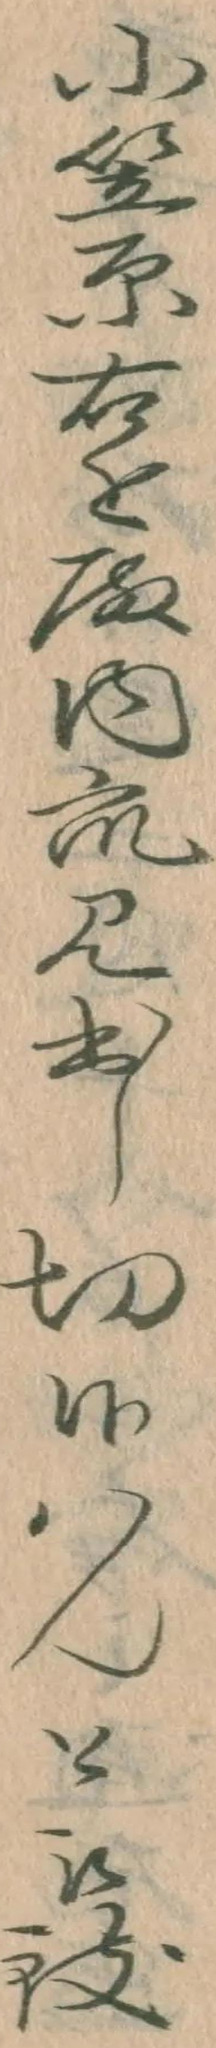小笠原右近殿内衆見出し切候はんと被致
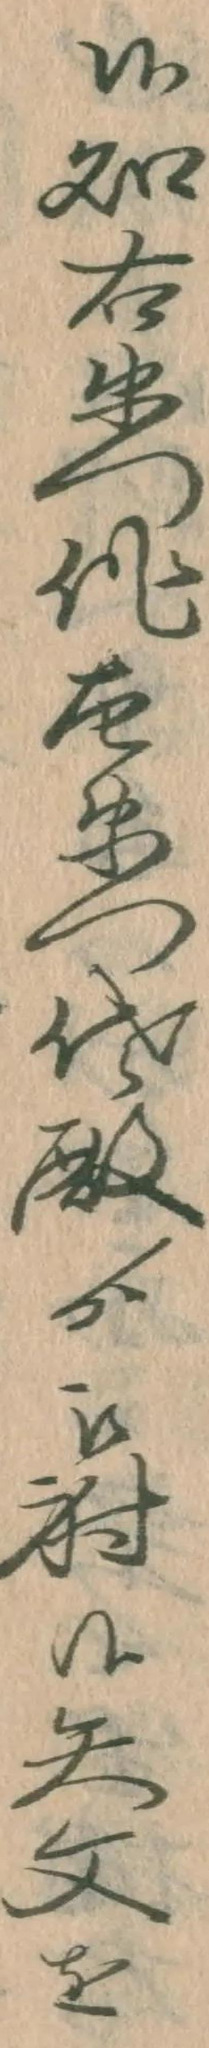候処右衛門作左衛門佐殿ゟ被射候矢文を
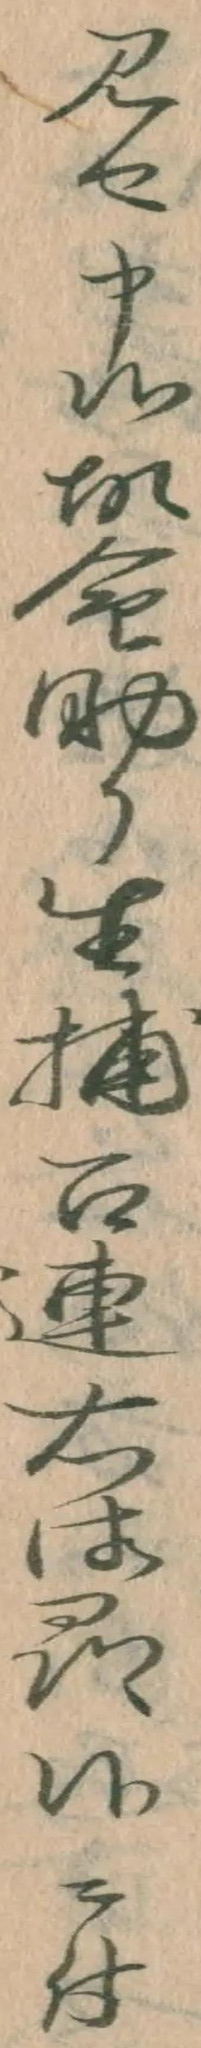見せ申候故命助り生捕召連右御尋候に付
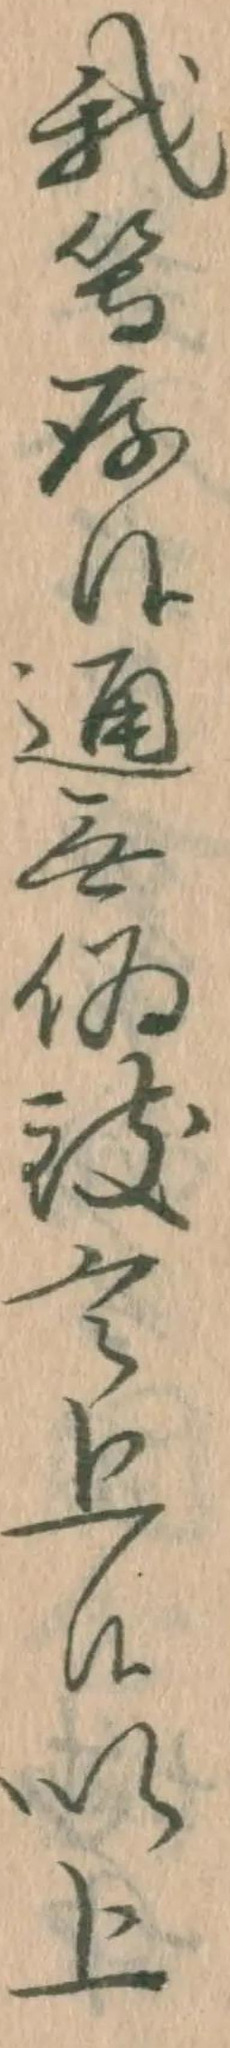我等存候通無偽致原言上候以上
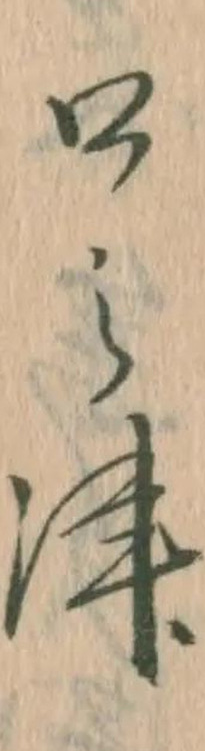口之津
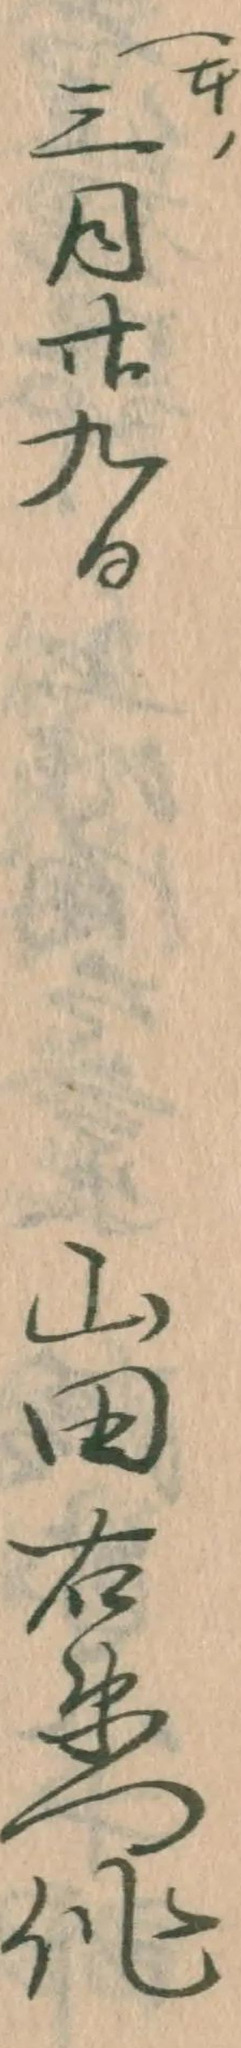三月廿九日山田右衛門作
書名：切支丹御退治記 49巻. [9]
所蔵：国立国会図書館 National Diet Library, JAPAN
